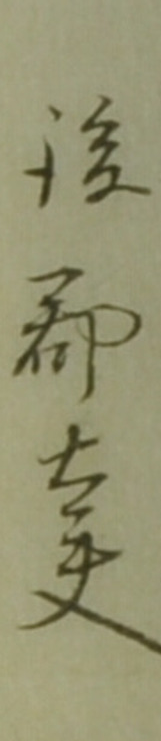後郡太夫

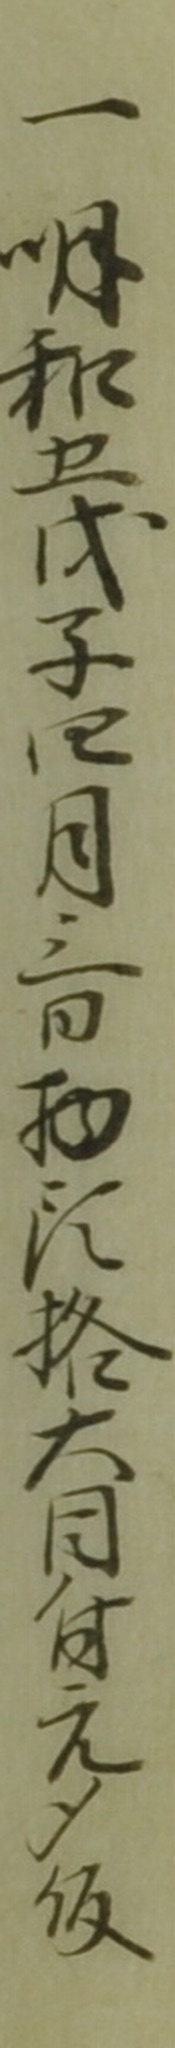一明和五戊子四月三日物頭格大目付元〆仮
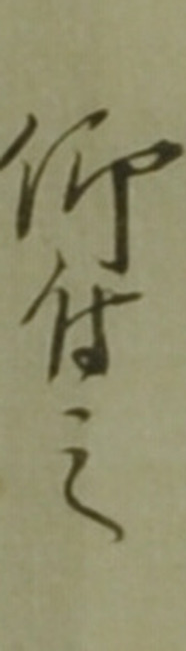仰付之
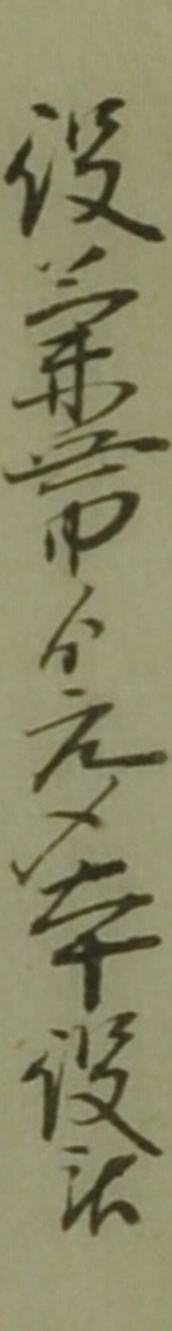役兼帯ゟ元〆本役被
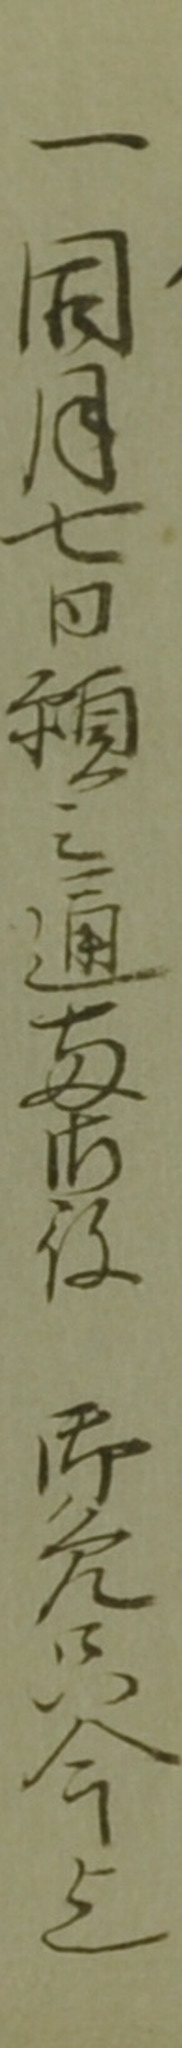一同月七日願之通両御役御免只今迄
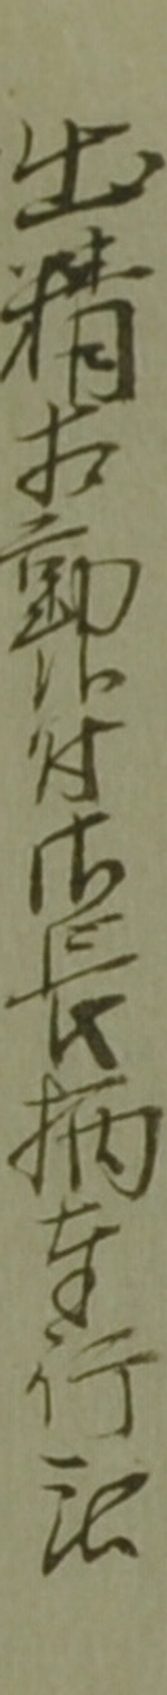出精相勤候付御長柄奉行被
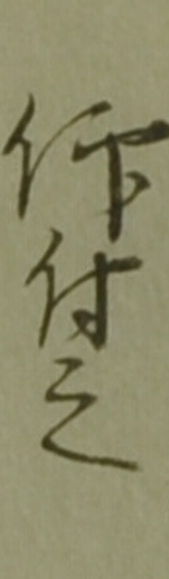仰付之
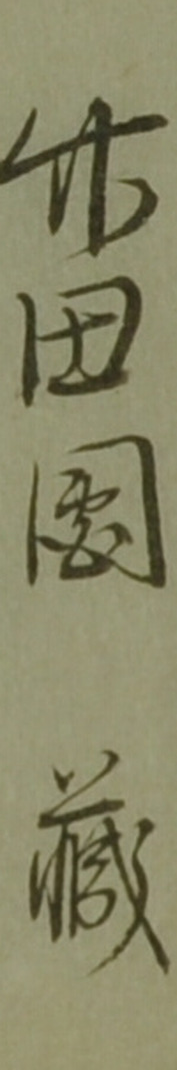竹田団蔵
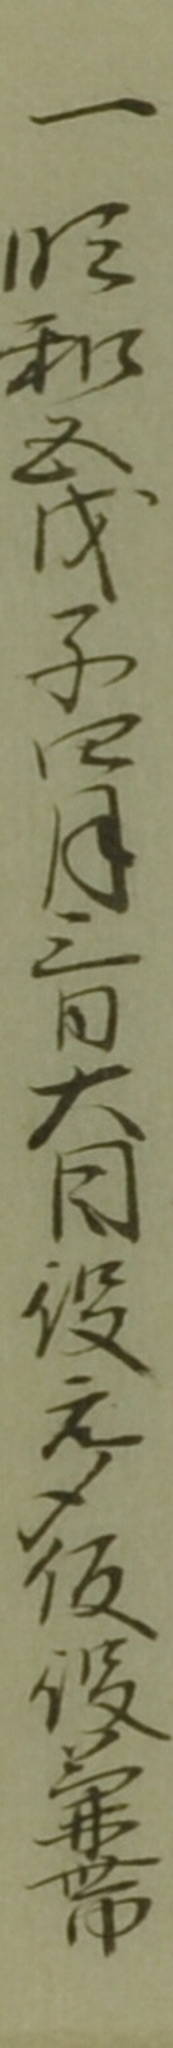一明和五戊子四月三日大目役元〆仮役兼帯
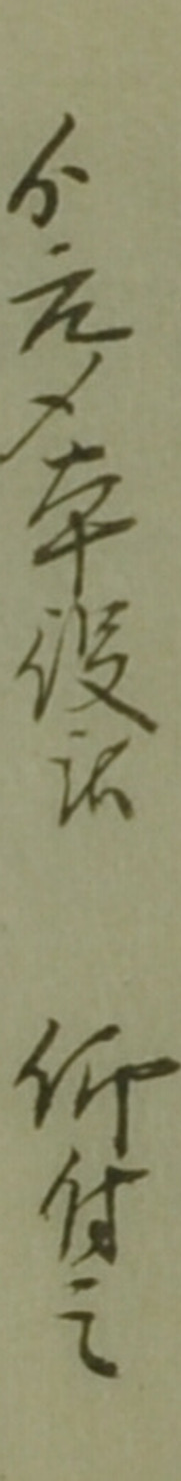ゟ元〆本役被仰付之
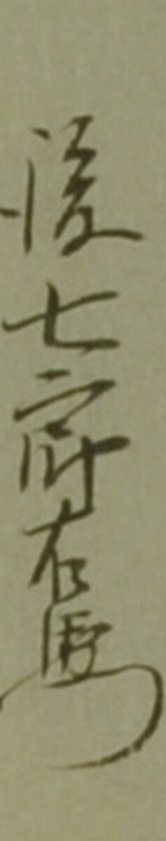後七郎右衛門
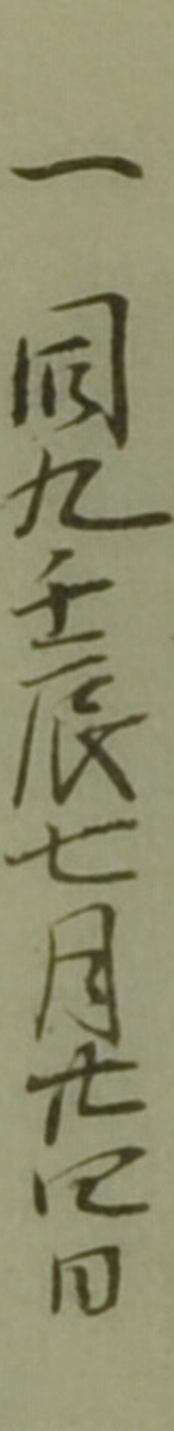一同九壬辰七月廿四日
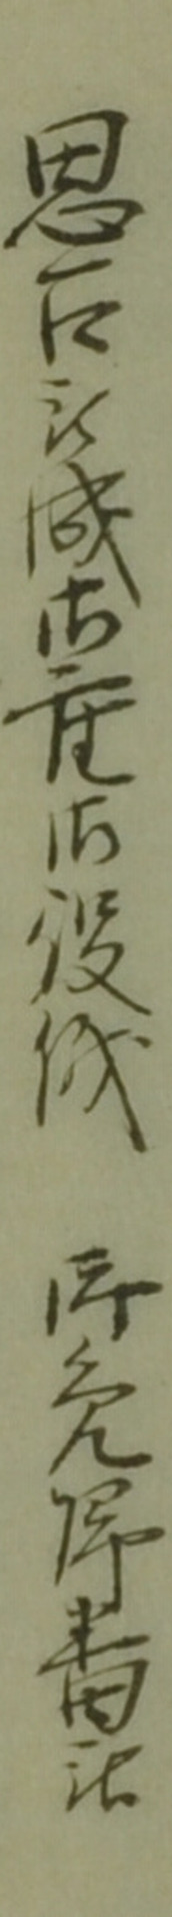思召被成御座御役儀御免帰番被
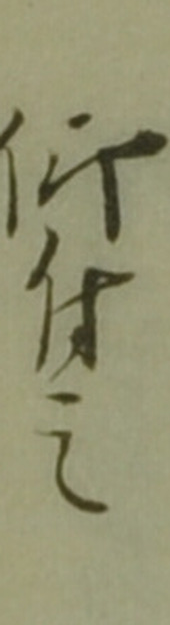仰付之
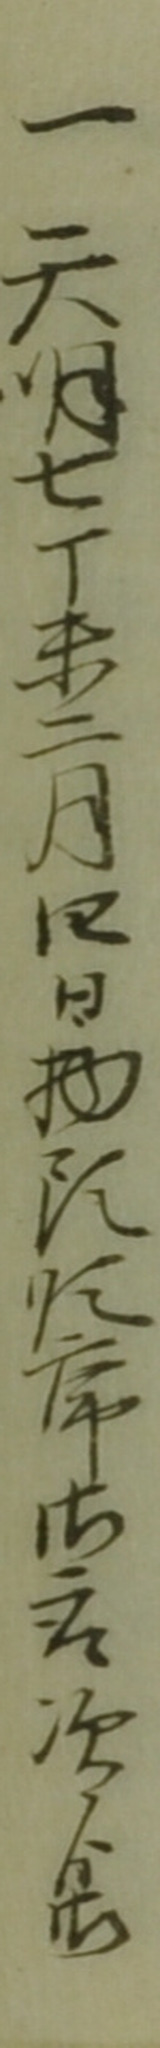一天明七丁未二月四日物頭次席御取次ゟ御
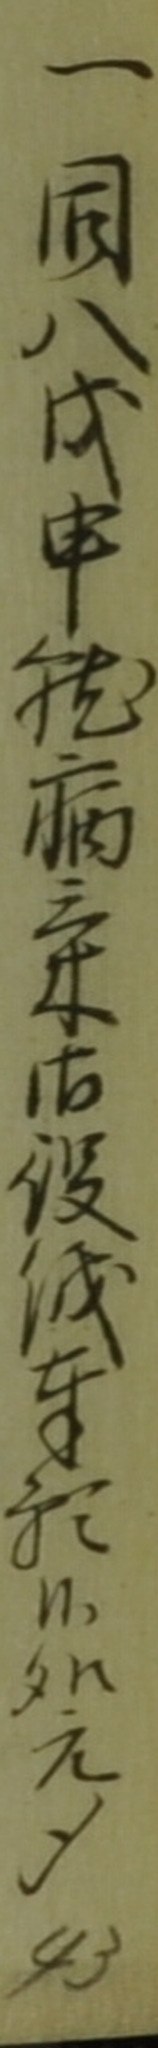一同八戊申就病気御役儀奉願候処元〆
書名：諸御役代々録（七）
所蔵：伊那市立高遠町図書館・合同会社AMANE
